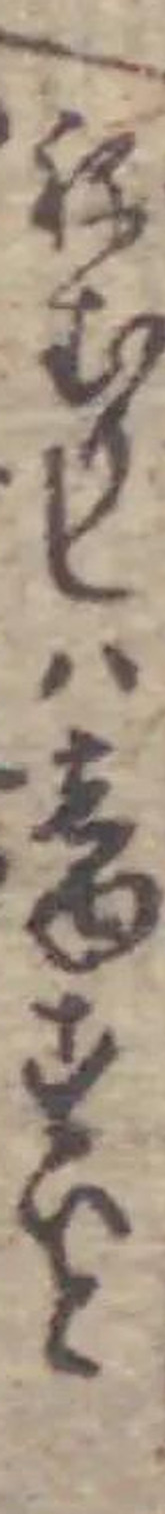ねむりしはしゆすいと
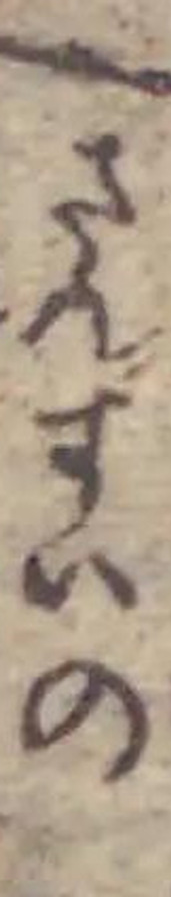さんすいの
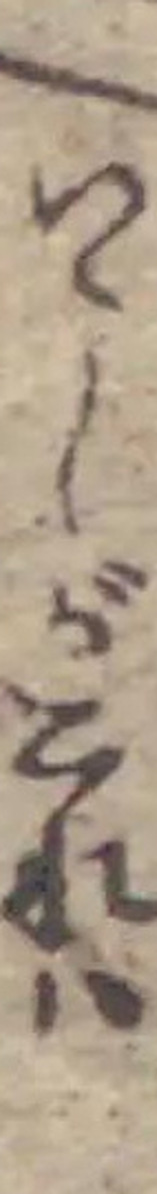いゝしがこれは
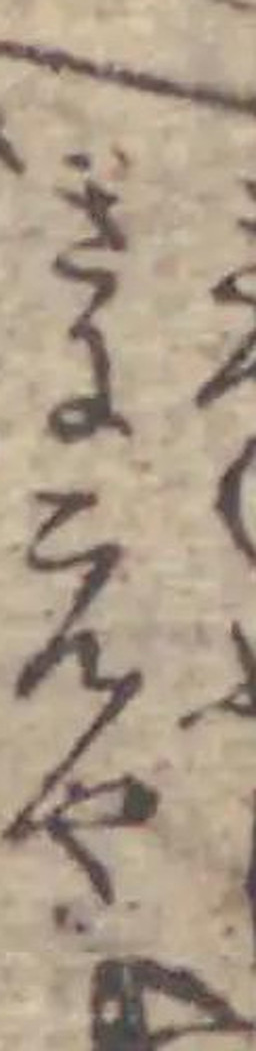きにこんや
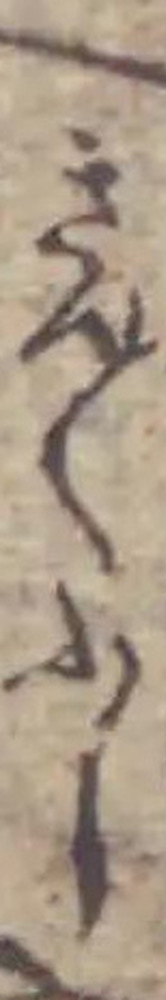きん〳〵ふし
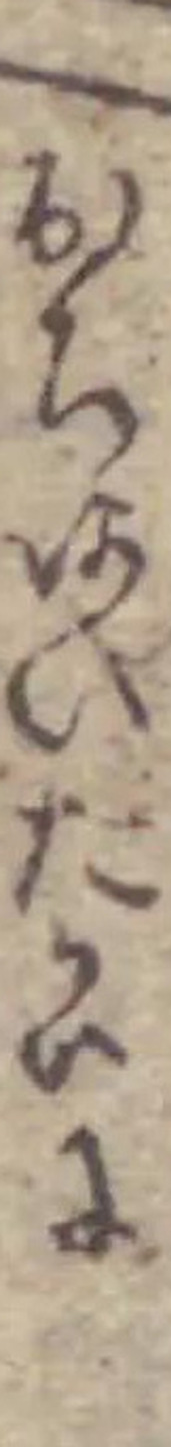おちあひたかいに
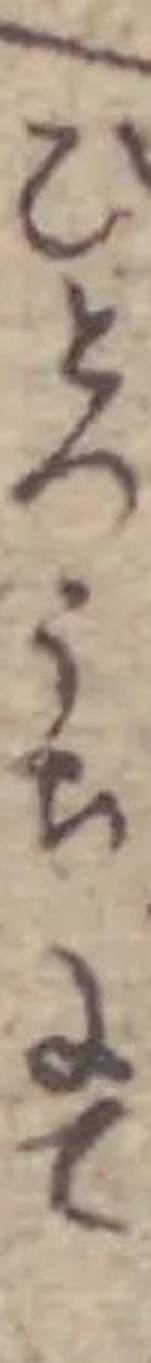ひとつうちにて
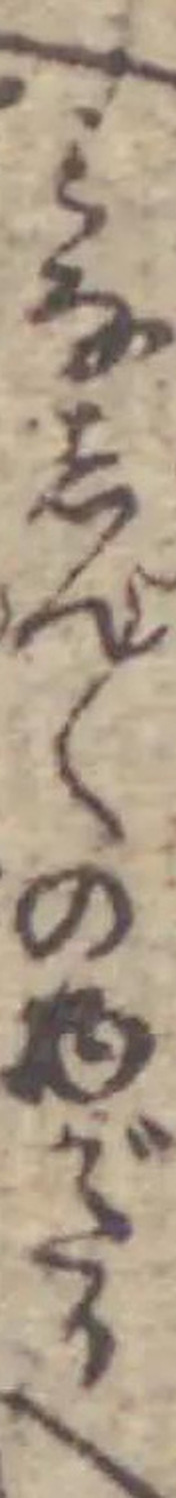みなしん〳〵の物がたり
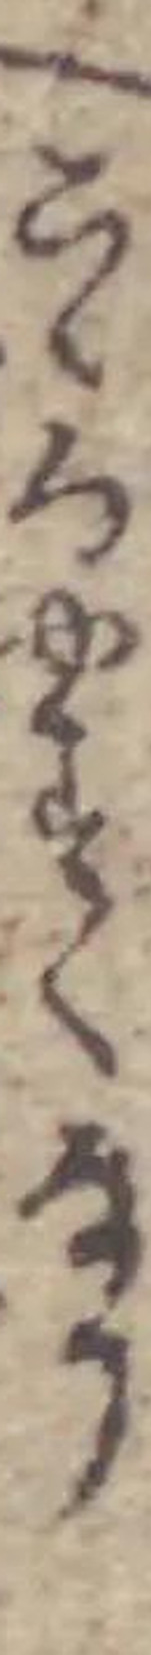こゝろやすくなり
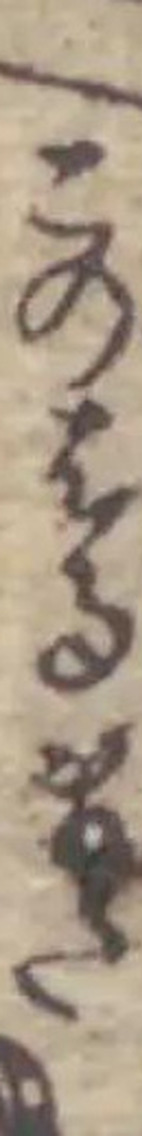このはるまた
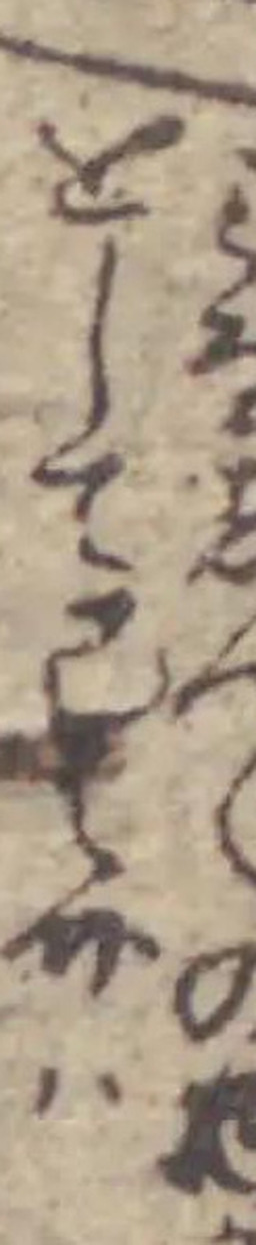をして巳之介は
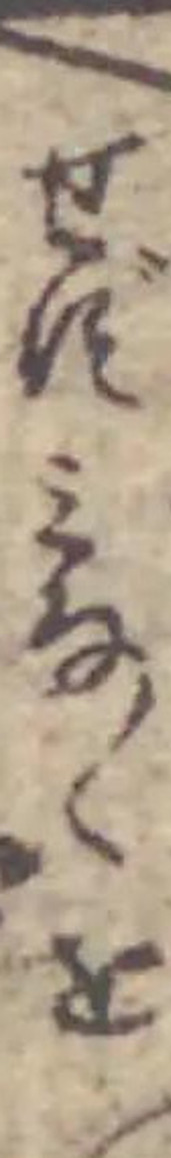せずみな〳〵を
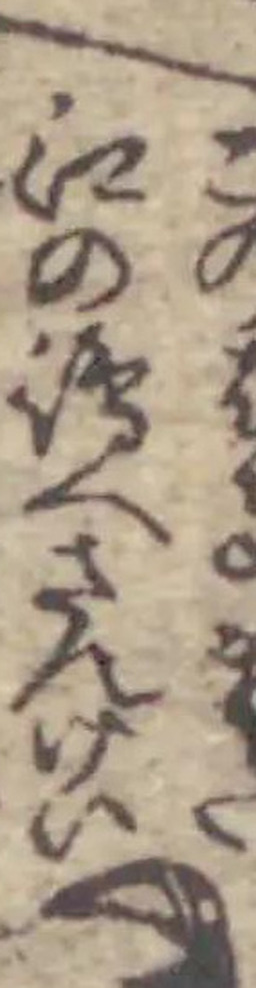江の嶋へさんけい
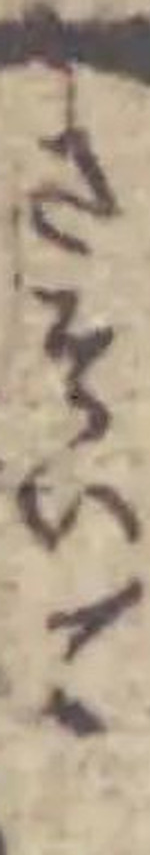さそいて
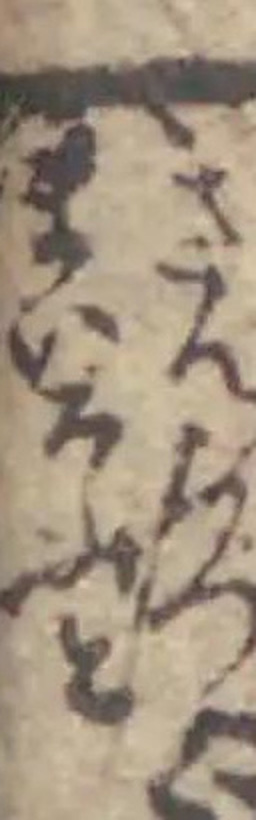まいろふと
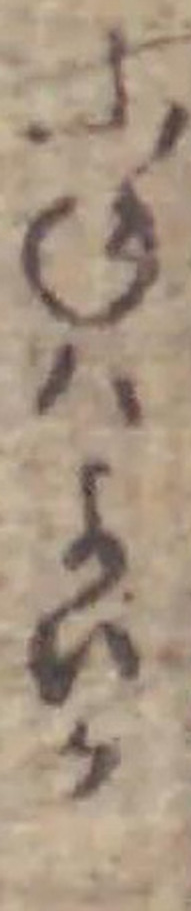ふねはよいか
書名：日待御利生此ごろ噂 3巻
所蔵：国立国会図書館 National Diet Library, JAPAN
